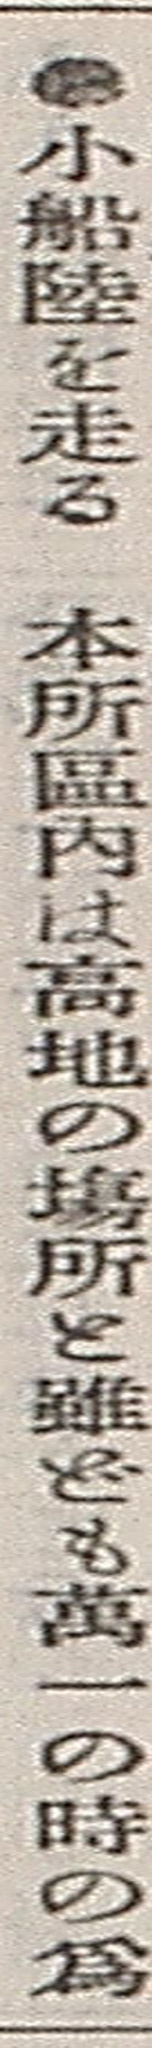●小船陸を走る本所区内は高地の場所と雖ども万一の時の為
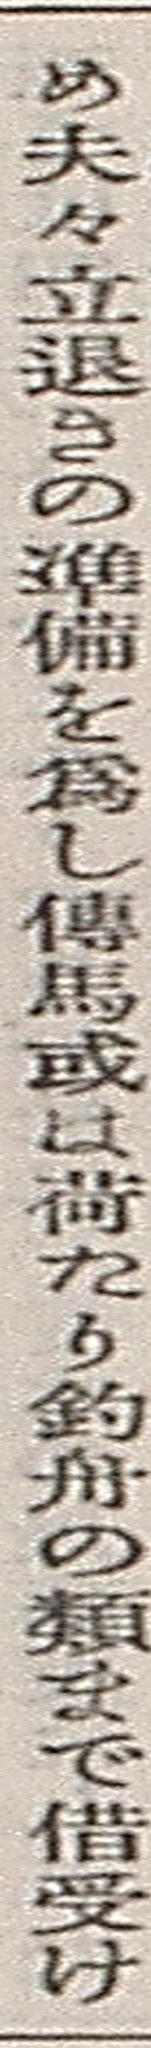め夫々立退きの準備を為し伝馬或は荷たり釣舟の類まで借受け
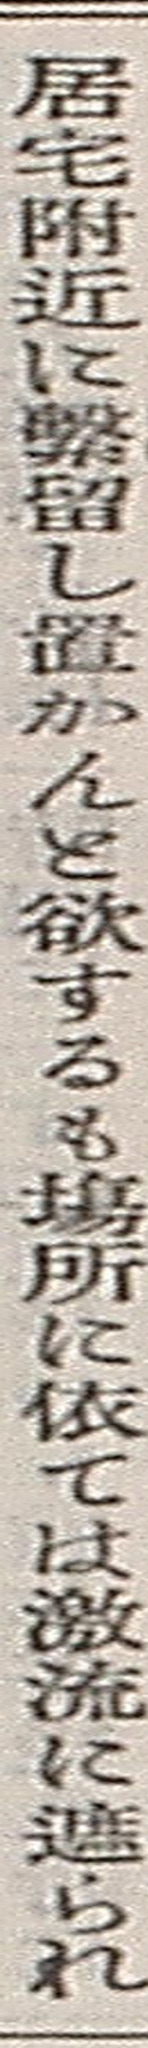居宅附近に繋留し置かんと欲するも場所に依ては激流に遮られ
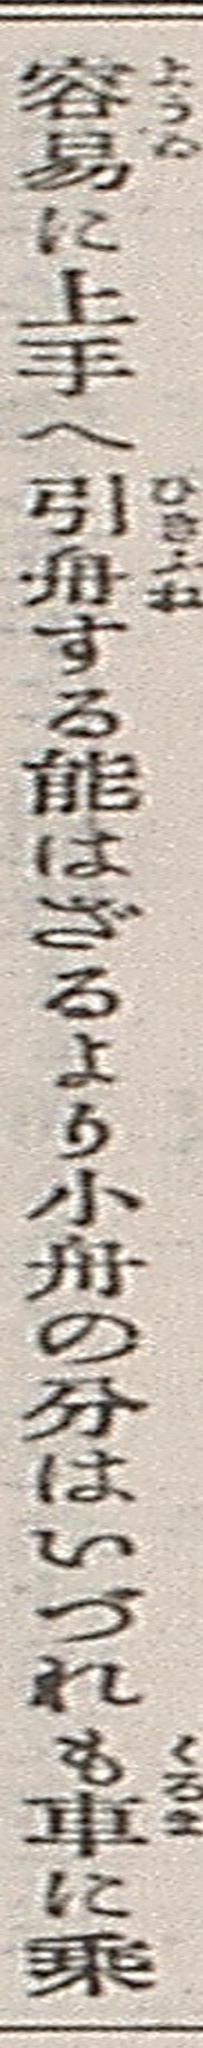容易に上手へ引舟する能はざるより小舟の分はいづれも車に乗
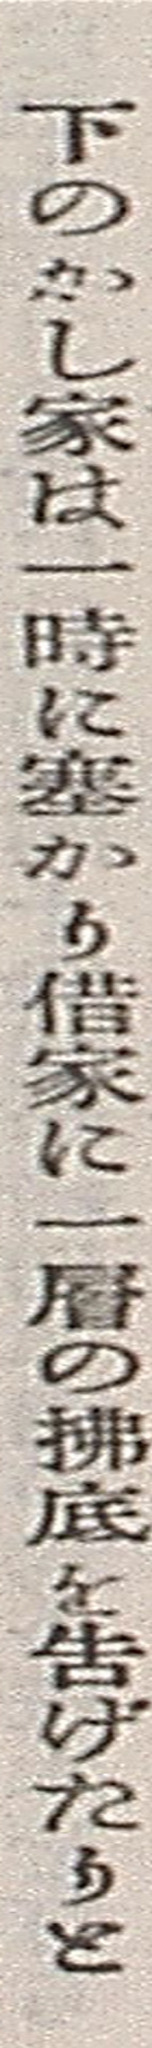下のかし家は一時に塞かり借家に一層の払底を告げたりと
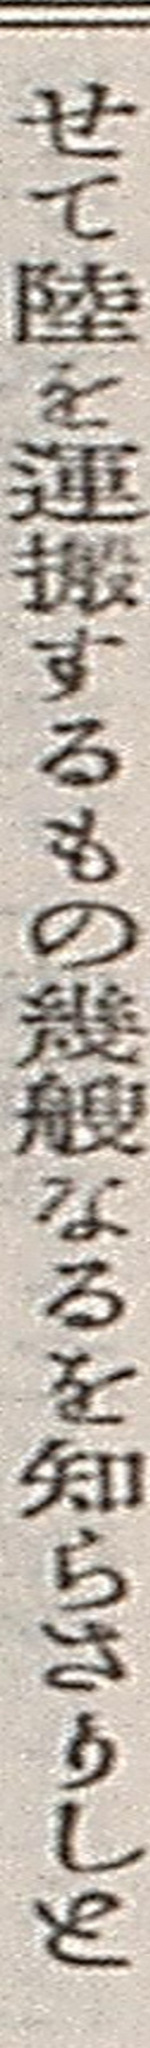せて陸を運搬するもの幾艘なるを知らさりしと
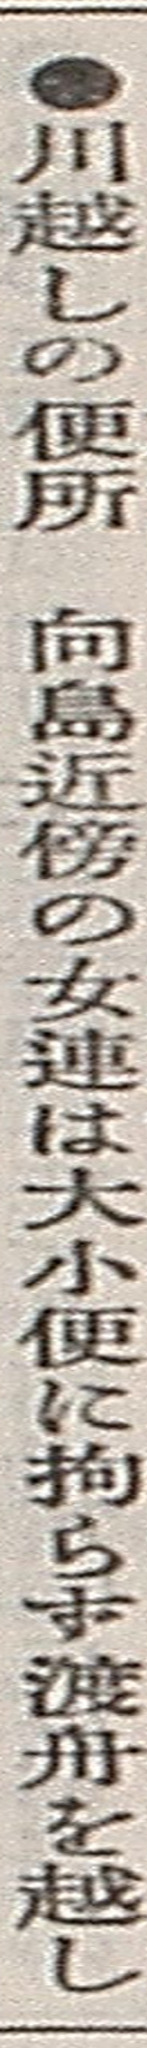●川越しの便所向島近傍の女連は大商便に拘らず渡舟を越し
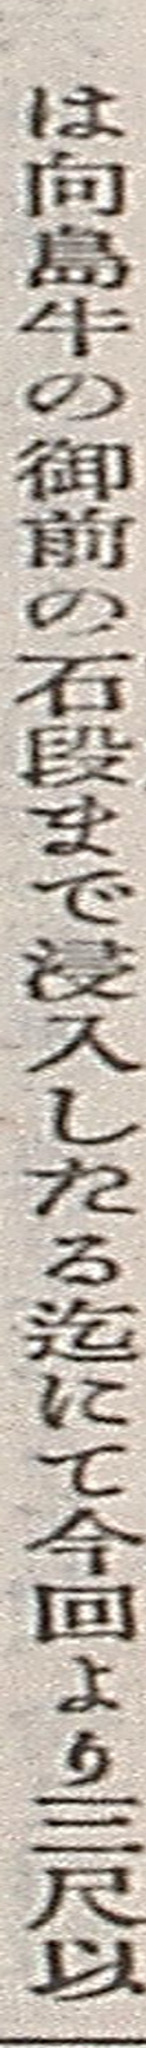は向島牛の御前の石段まで侵入したる迄にて今回より三尺以
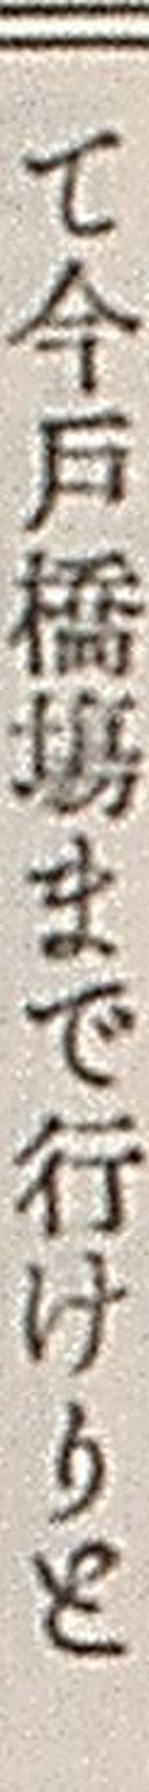て今戸橋場まで行けりと
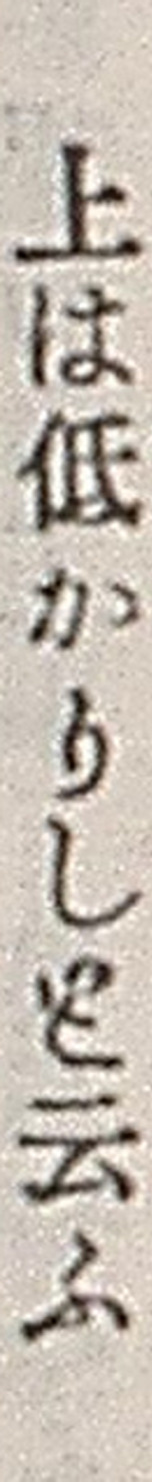上は低かりしと云ふ
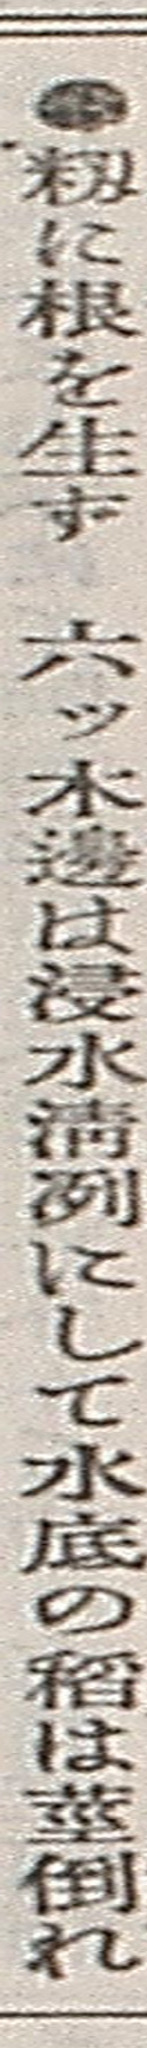●籾に根を生ず六ツ木辺は浸水清冽にして水底の稲は茎倒れ
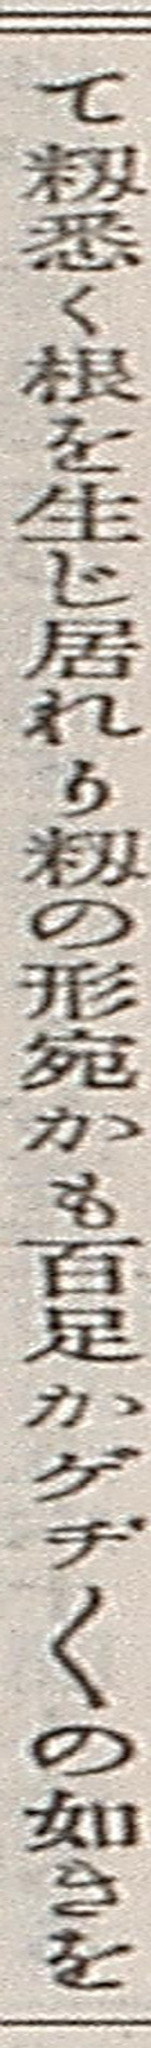て籾悉く根を生じ居れり籾の形宛かも百足かゲヂ〳〵の如きを
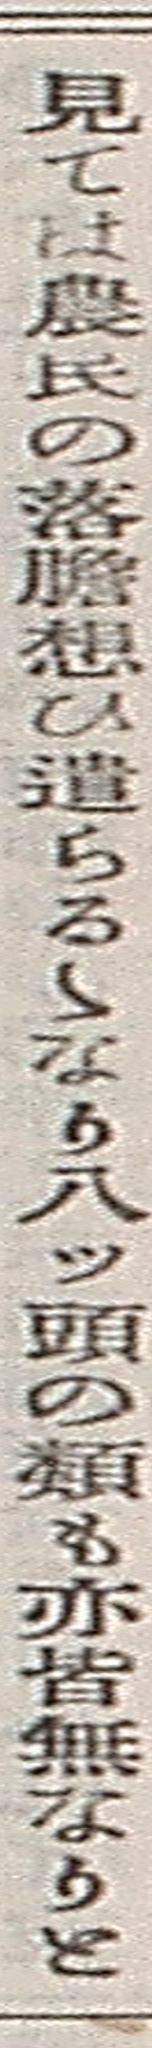見ては農民の落膽想ひ遣らるゝなり八ツ頭の類も亦皆無なりと
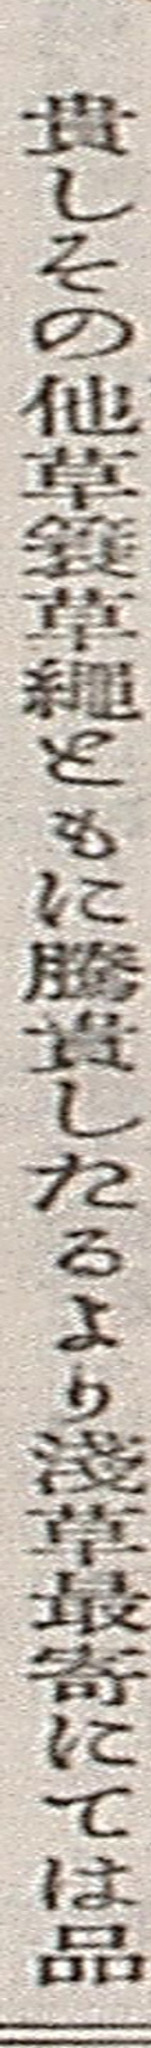貴しその他草簑草縄ともに騰貴したるより浅草最寄にては品
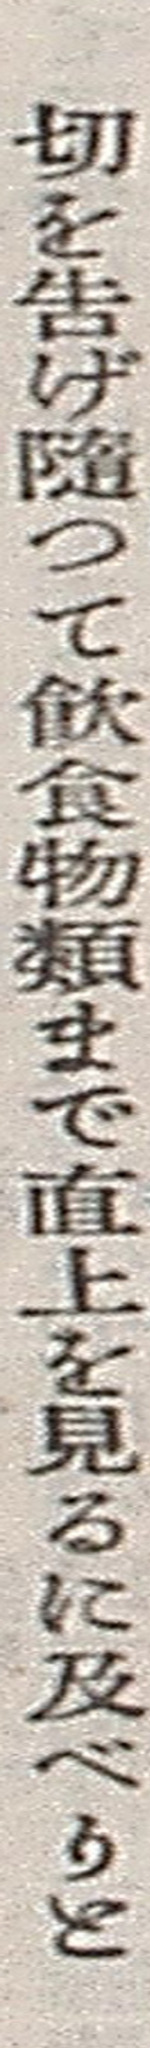切を告げ随つて飲食物類まで直上を見るに及べりと
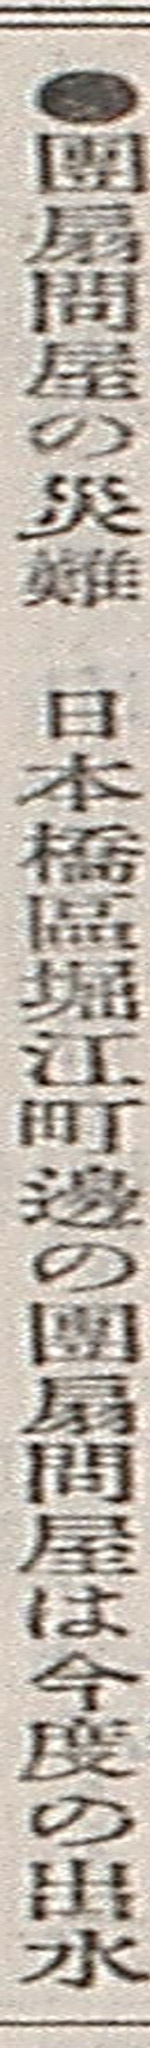●団扇問屋の災難日本橋区堀江町辺へんの団扇問屋は今度の出水
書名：風俗畫報臨時増刊第百二十四號　洪水地震被害録（上）
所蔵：東京大学地震研究所図書室 Earthquake Research Institute Library, The University of Tokyo, JAPAN
